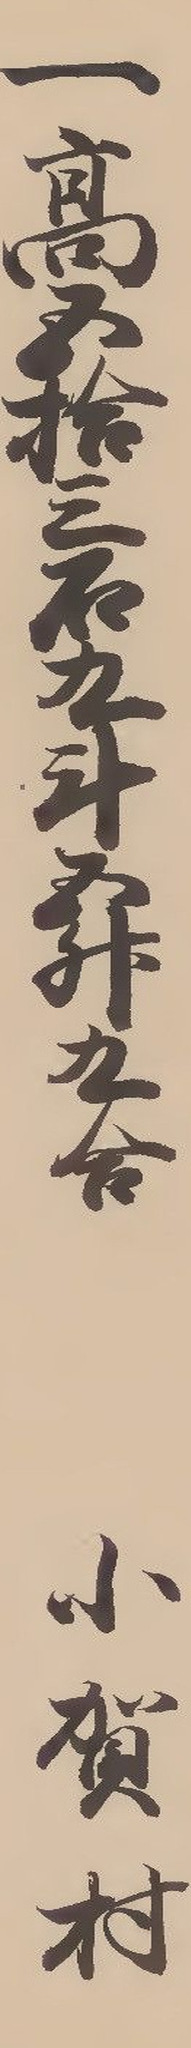一高五拾三石九斗五升九合小賀村
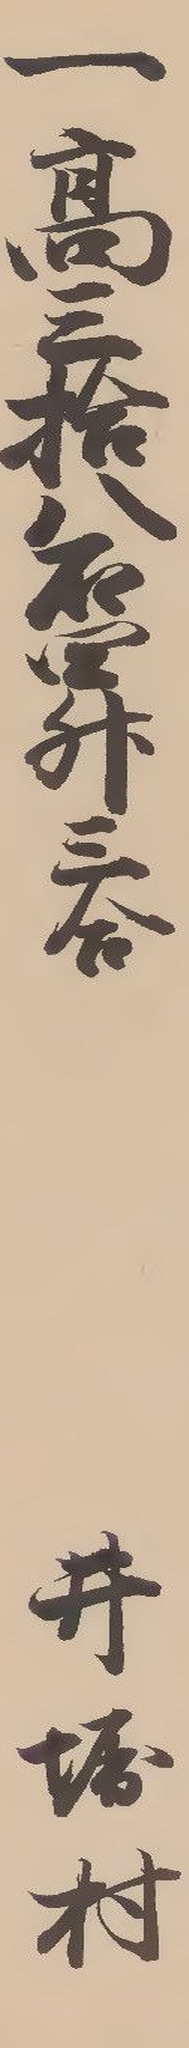一高三拾八石四升三合井堀村

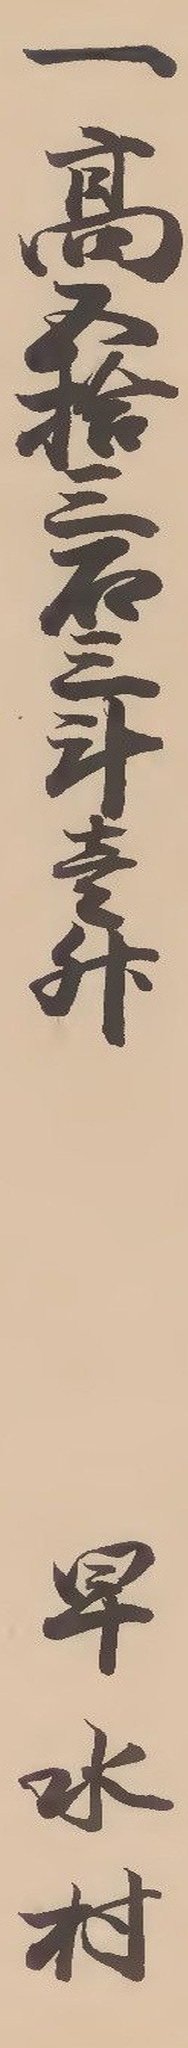一高五拾三石三斗壱升早水村
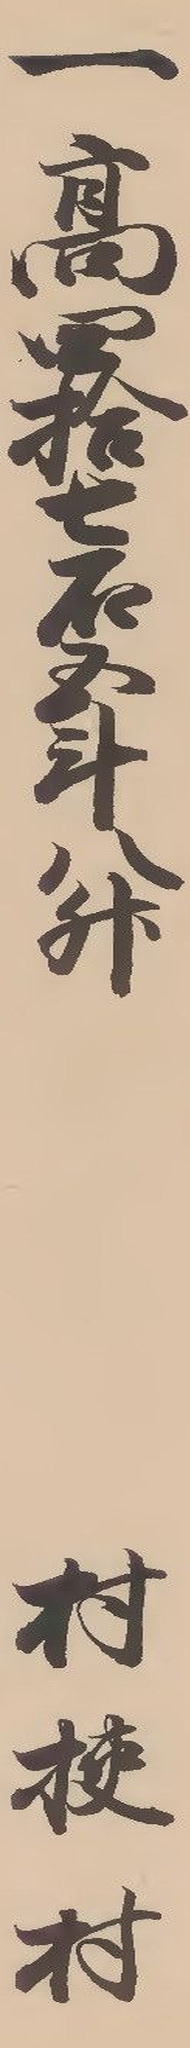一高四拾七石五斗八升村挟村
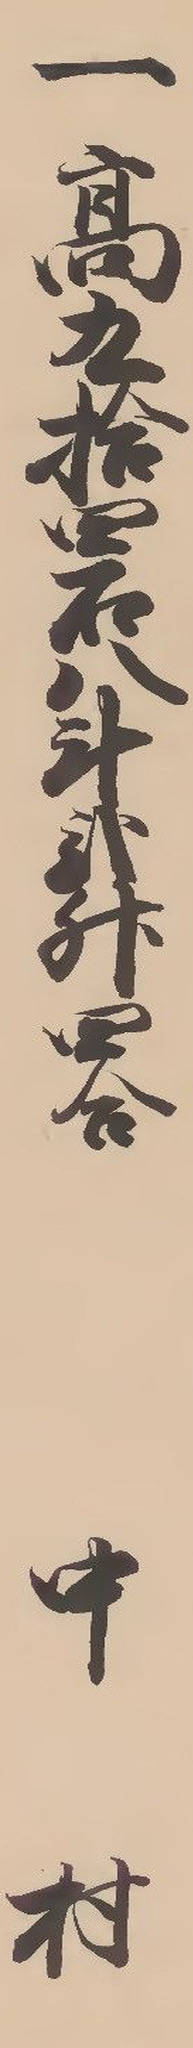一高九拾四石八斗弐升四合中村
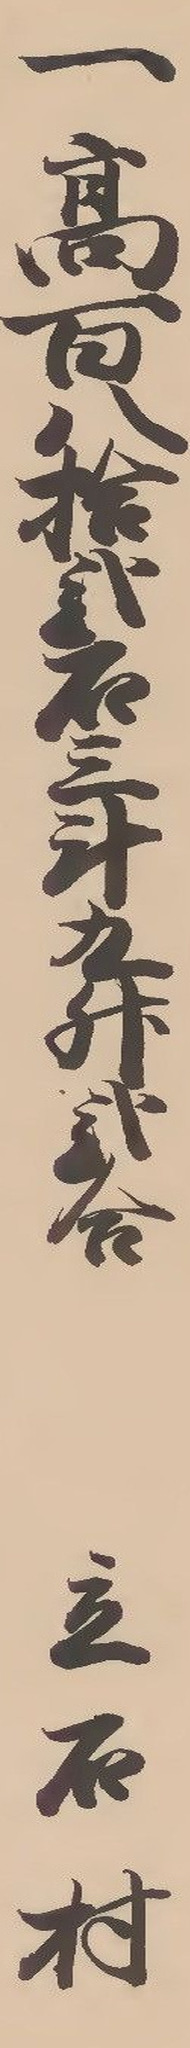一高百八拾弐石三斗九升弐合立石村
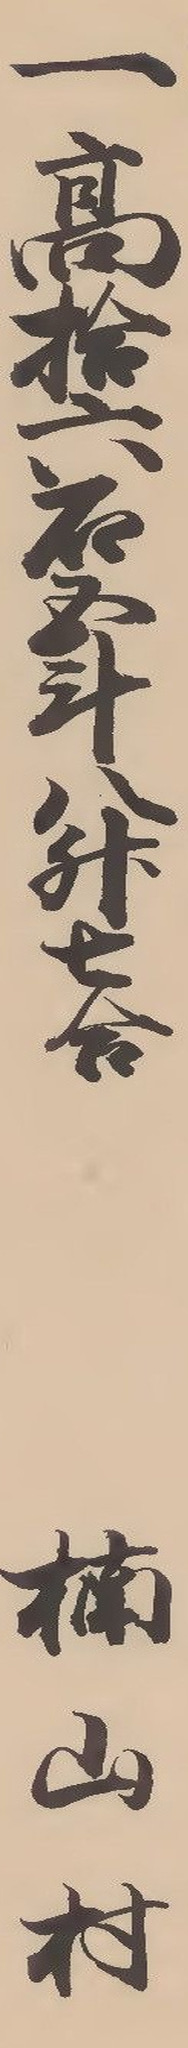一高拾六石五斗八升七合楠山村
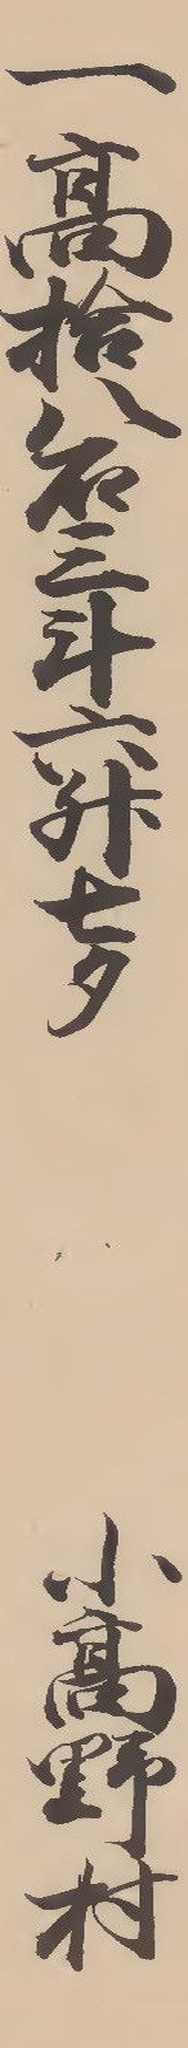一高拾八石三斗六升七勺小高野村
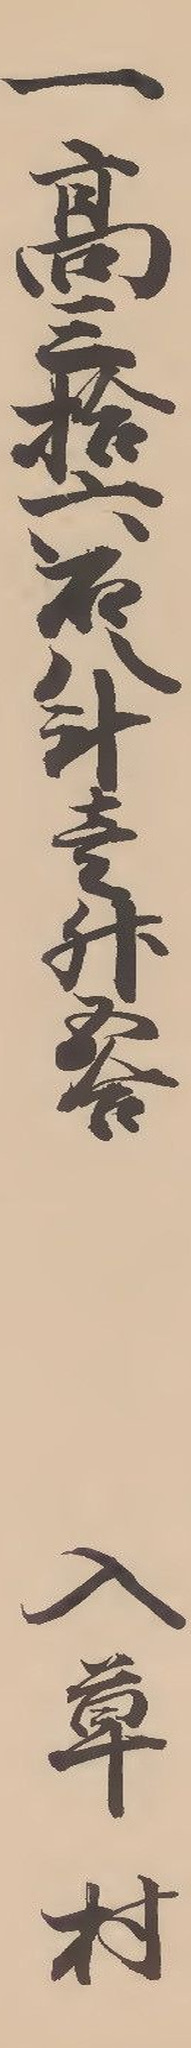一高三拾六石八斗壱升五合入草村
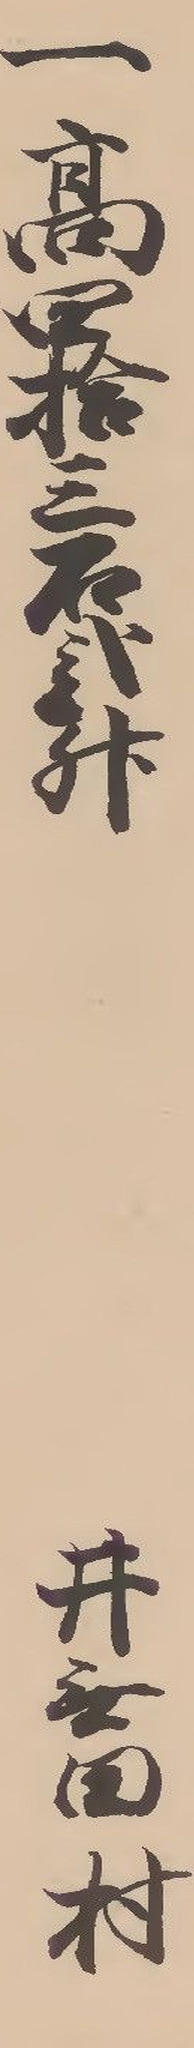一高四拾三石弐升井無田村

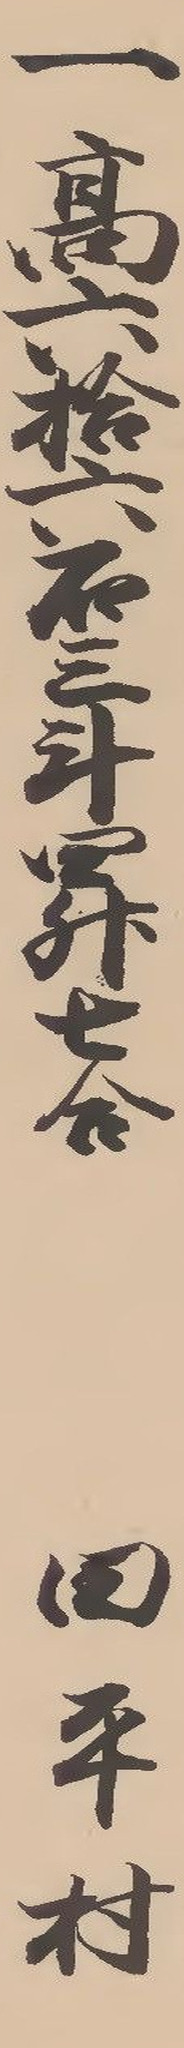一高六拾六石三斗四升七合田平村
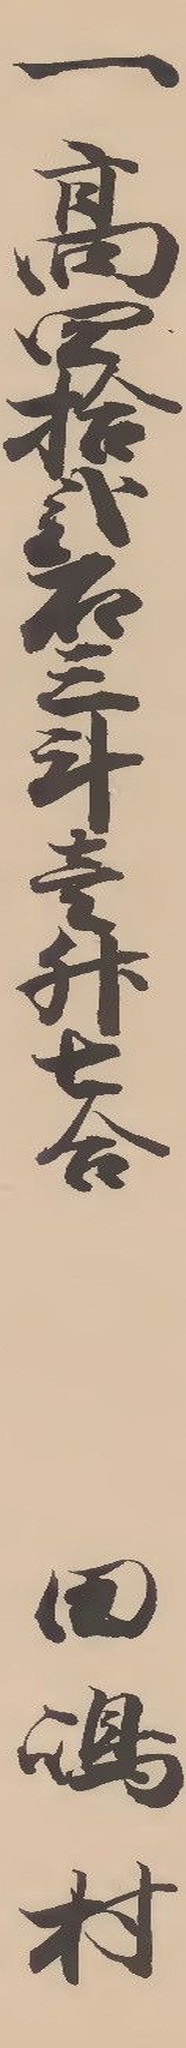一高四拾弐石三斗壱升七合田島村
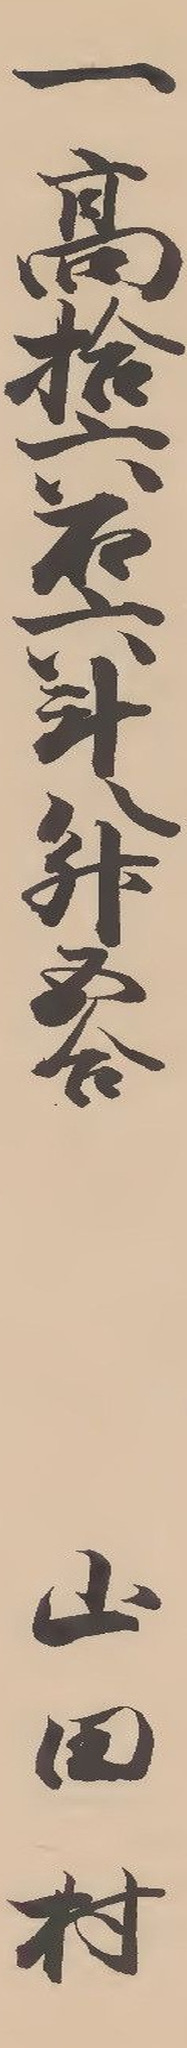一高拾六石六斗八升五合山田村
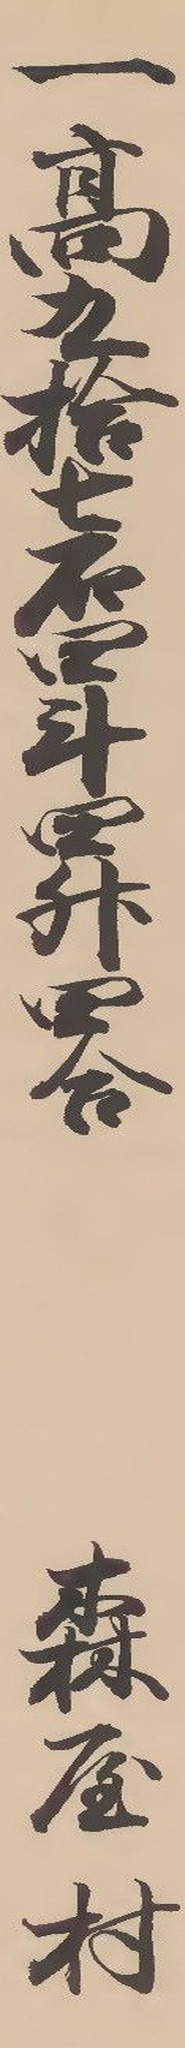一高九拾七石四斗四升四合森屋村
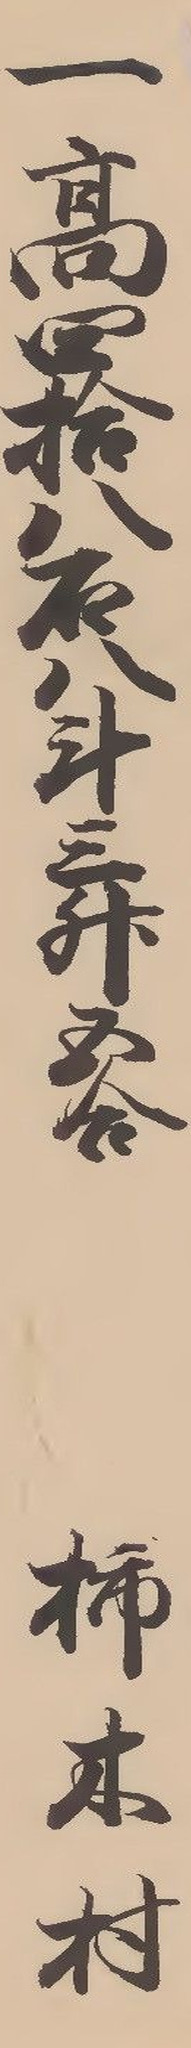一高四拾八石八斗三升五合柿木村
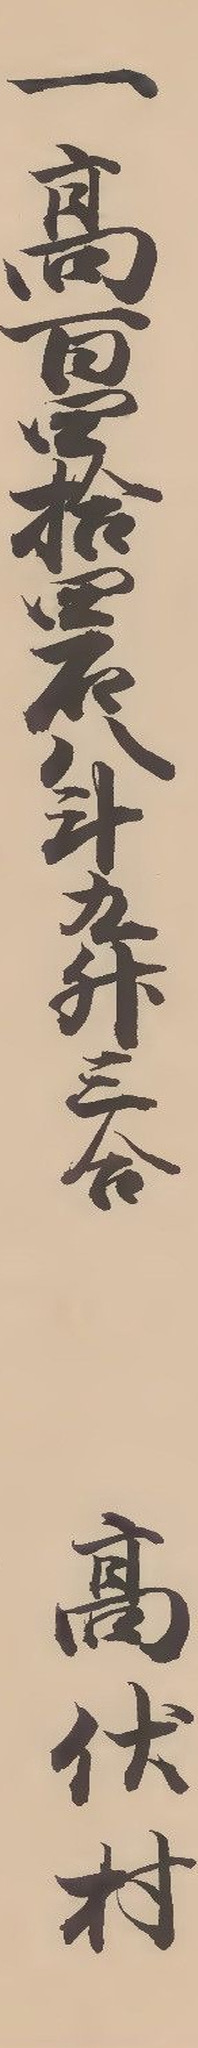一高百四拾四石八斗九升三合高伏村
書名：豊後国郷帳
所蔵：国立公文書館 National Archives of Japan
